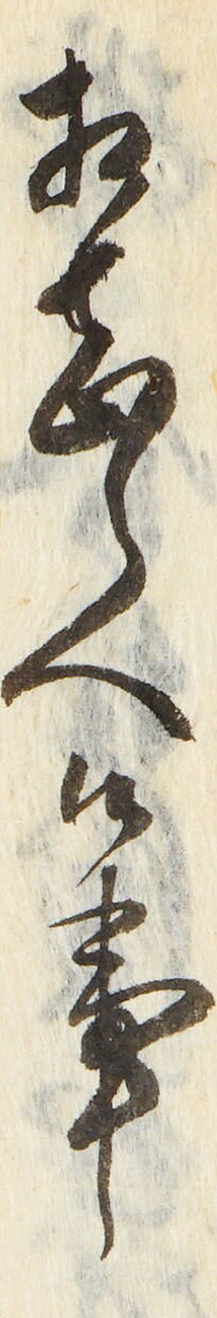相しらへ候事
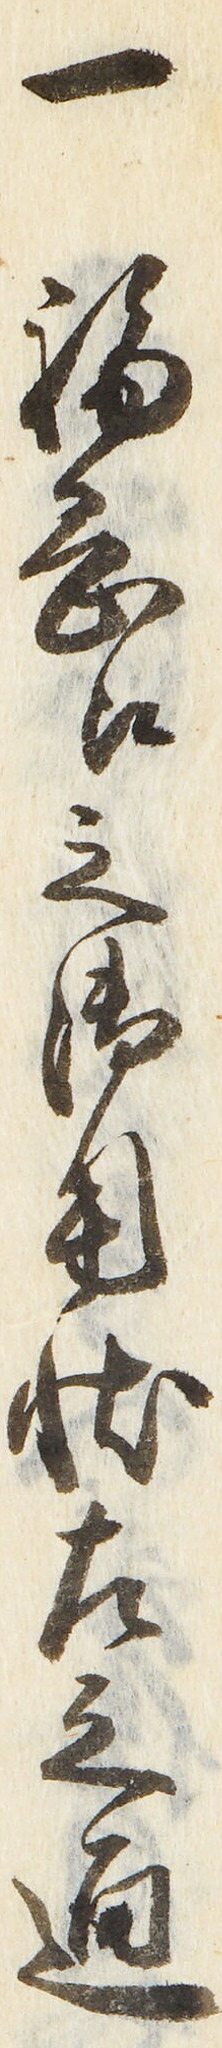一福岡江之御用状左之通
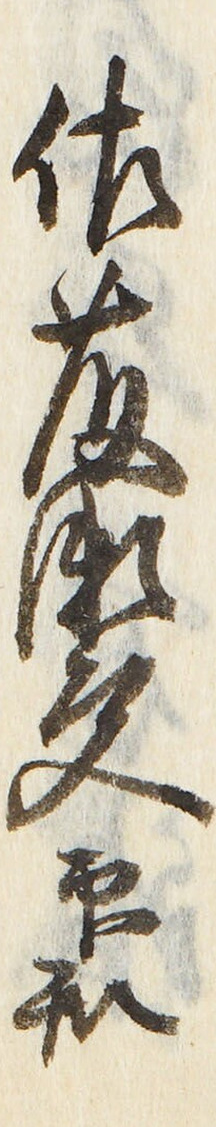佐藤瀬大夫印形
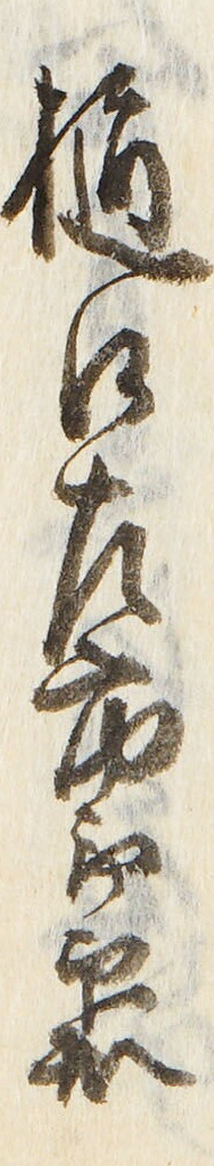樋口左市郎印形
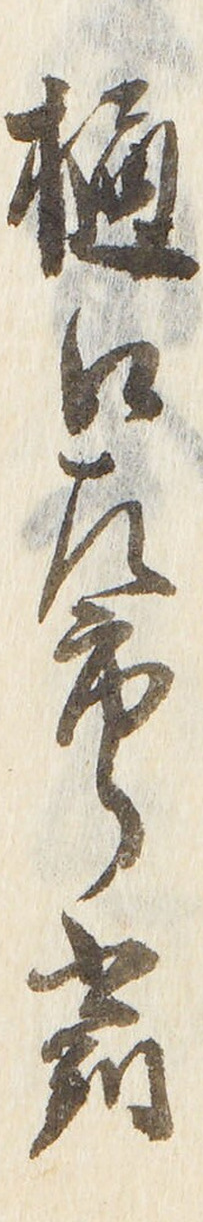樋口左市郎印形
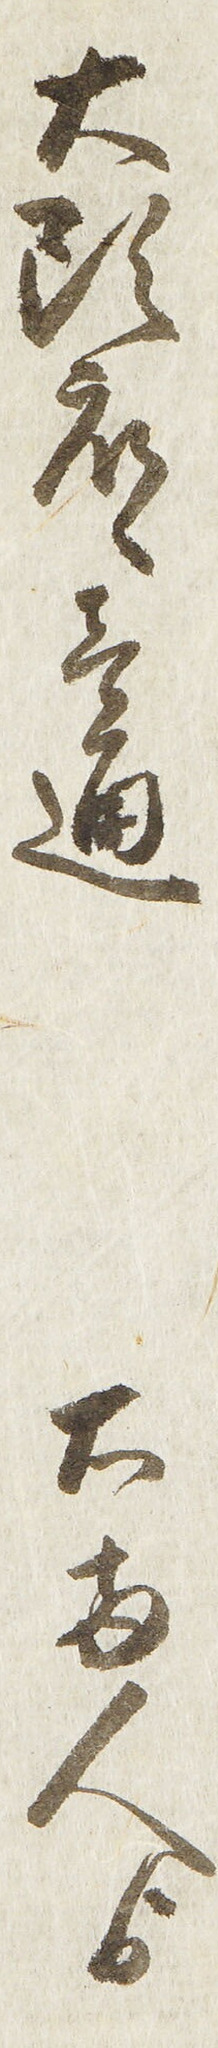大頭衆へ壱通右両人ゟ
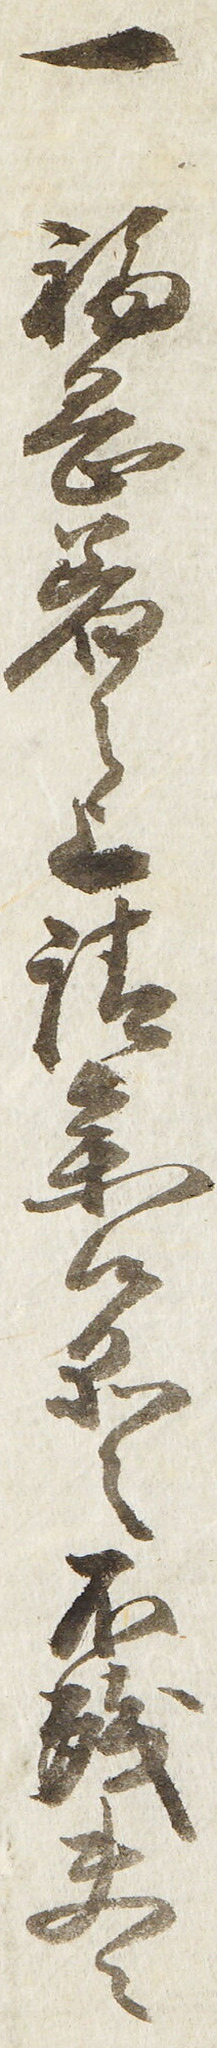一福岡着之上請参候品々不残夫々
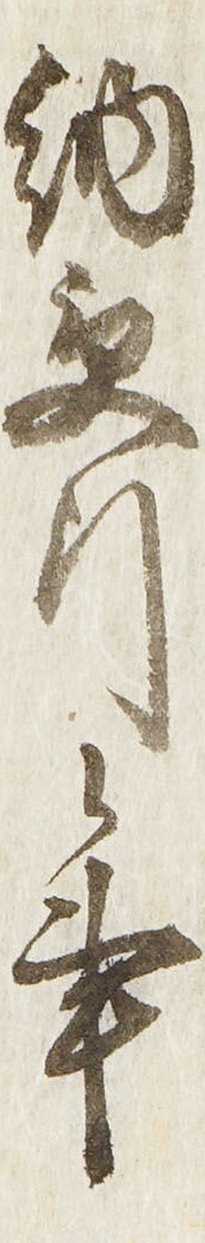納受引候事
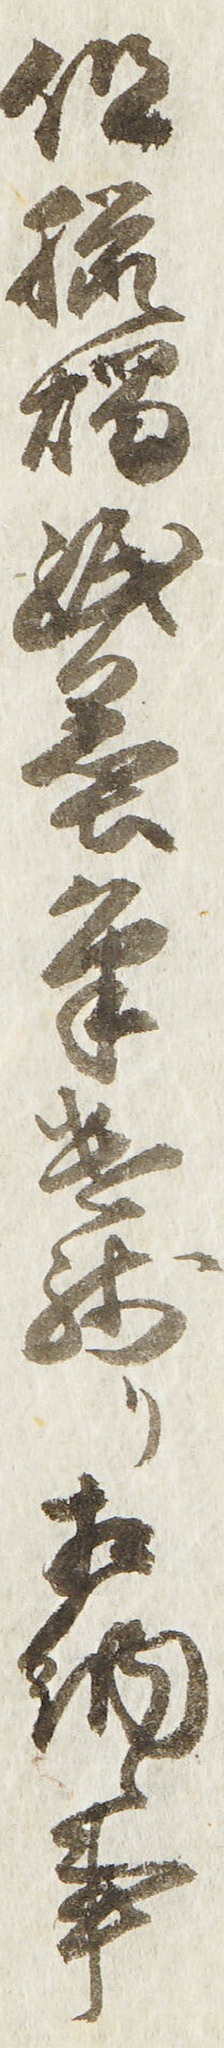但蝋燭紙墨筆遣残り相納候事
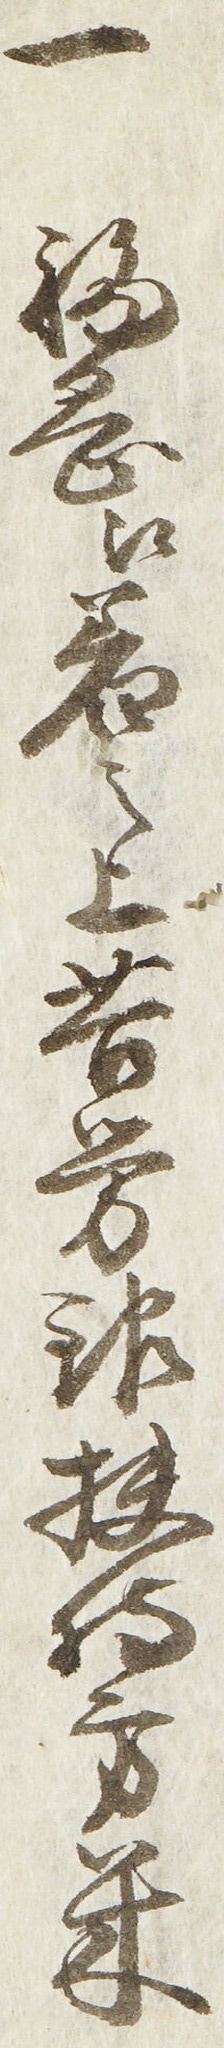一福岡江着之上苦労銀扶持方米
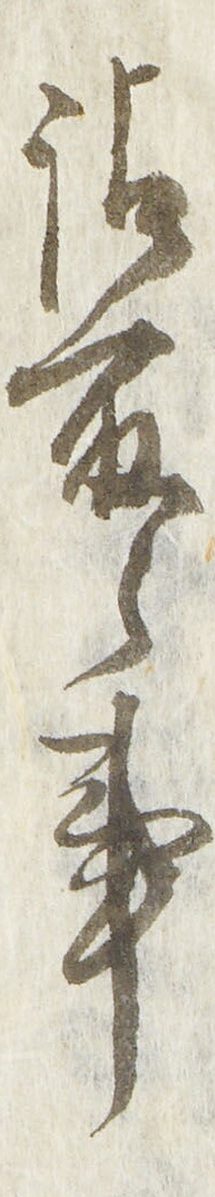請取候事

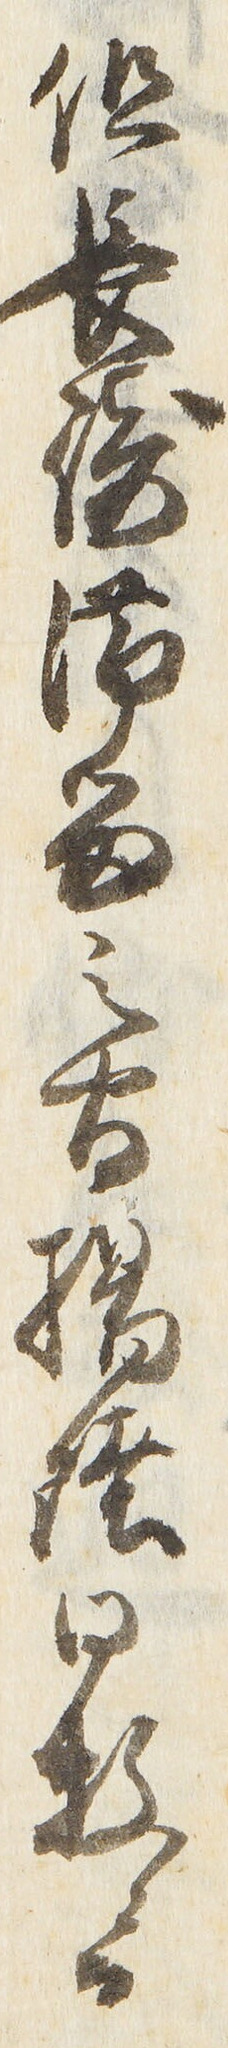但長崎滞留之間揚陸日数ニ而
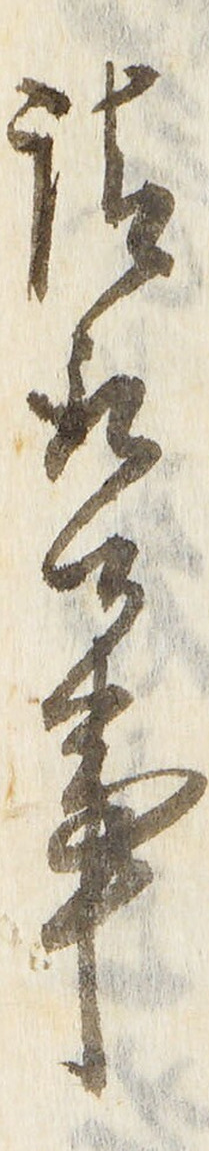請取候事
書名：玄海嶋江漂着船為警固長崎江被越候覚
